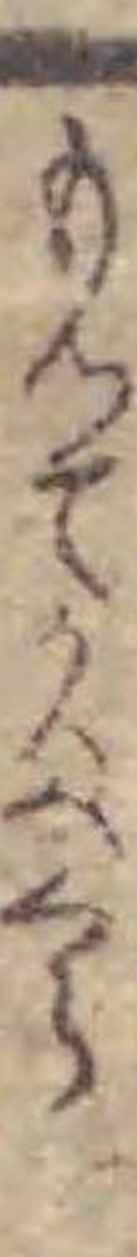もつてかまくら
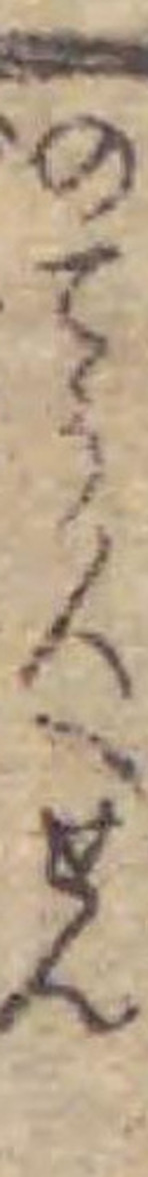のてう人へせん
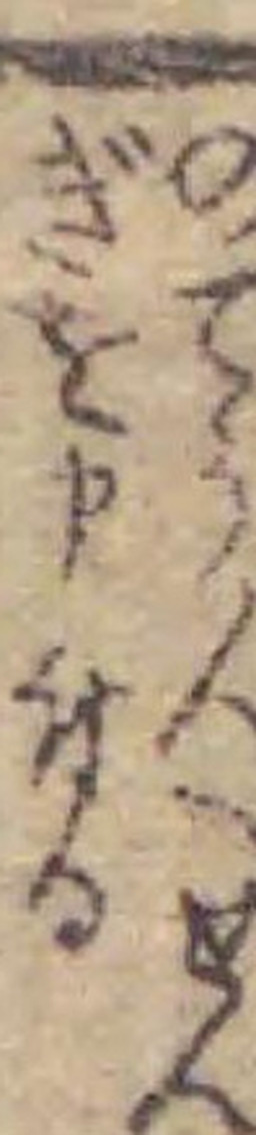ぎを申付る
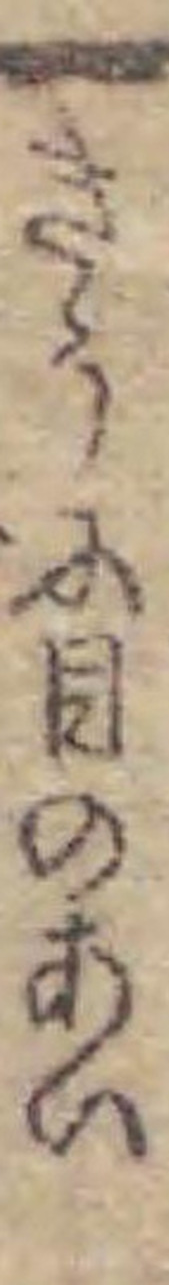きうに目のあい
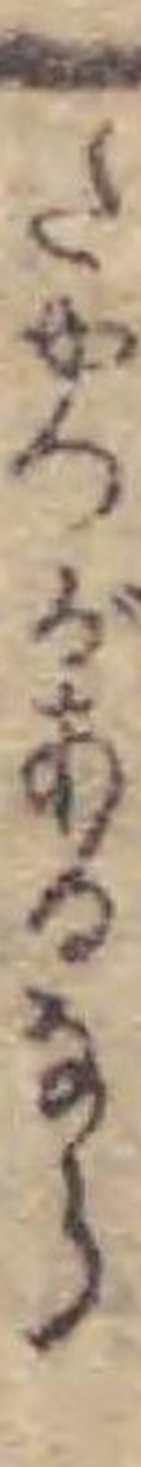たやつがあるなら
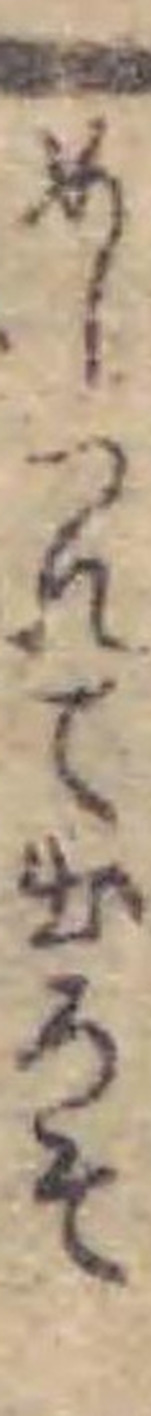めしつれて出ろそ
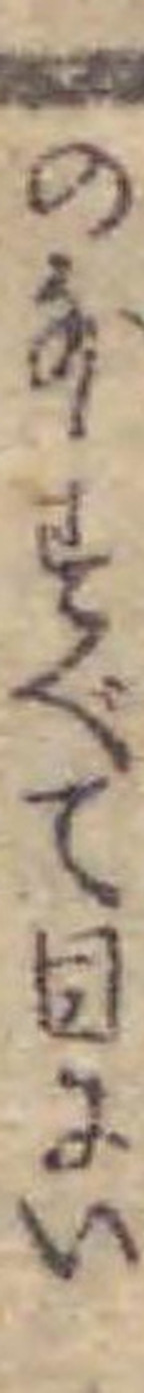の外すべて目にい
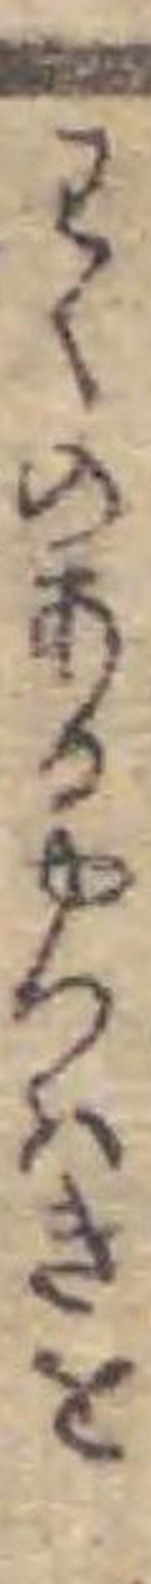わくのあるやつはきを
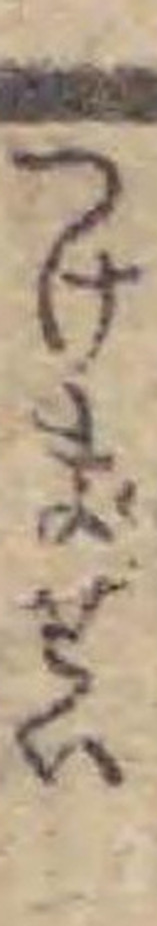つけませい
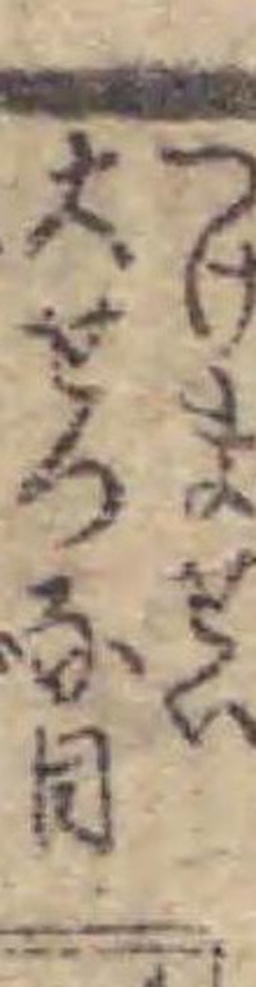大せつな目
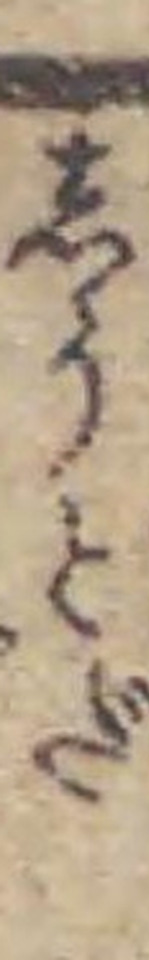しうとだ
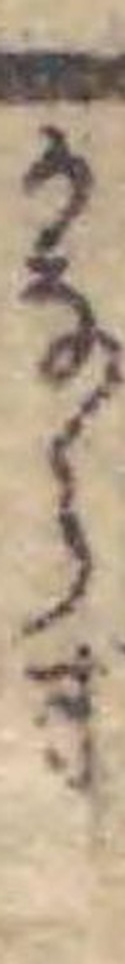かならず
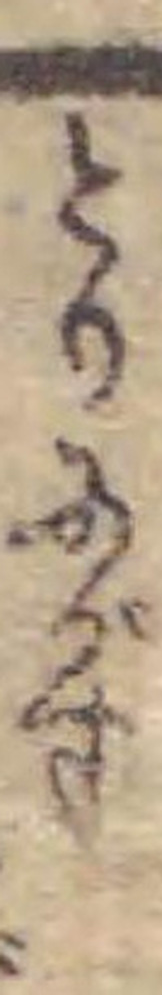とりにがす
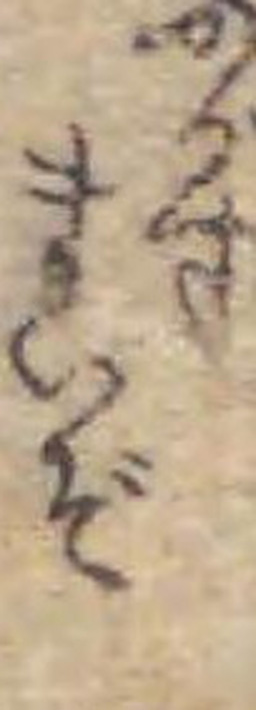まいぞ
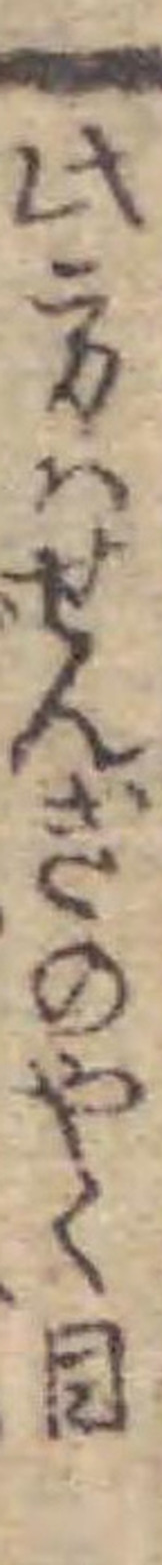此方はせんぎのやく目
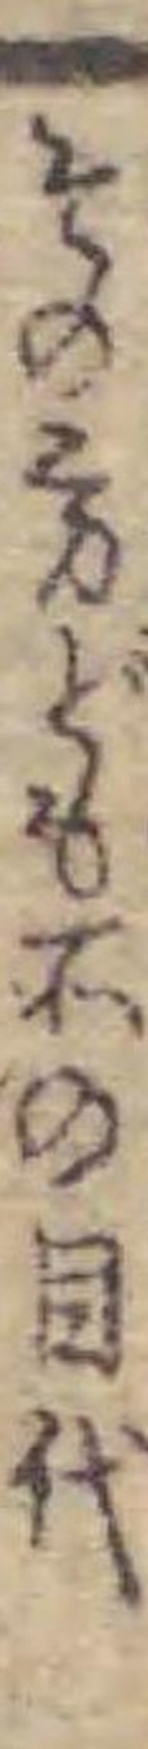その方ども所の目代
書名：悪七変目景清 : 2巻
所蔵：国立国会図書館 National Diet Library, JAPAN
